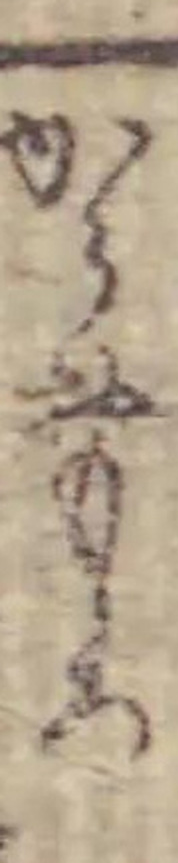からおもしろ
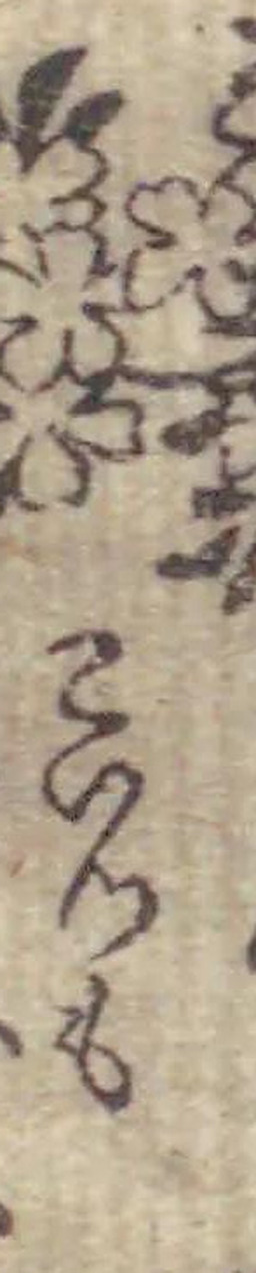こいつも
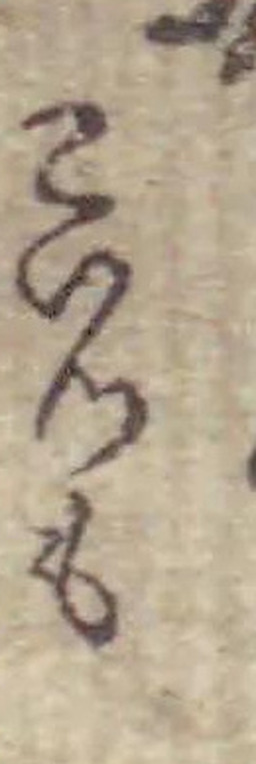こいつも
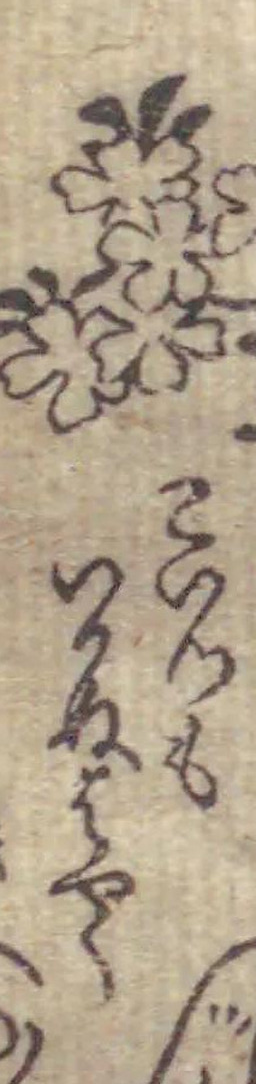いかぬはやく
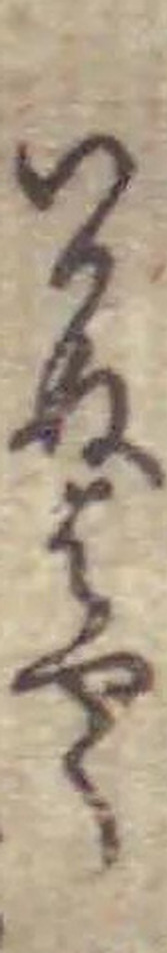いかぬはやく
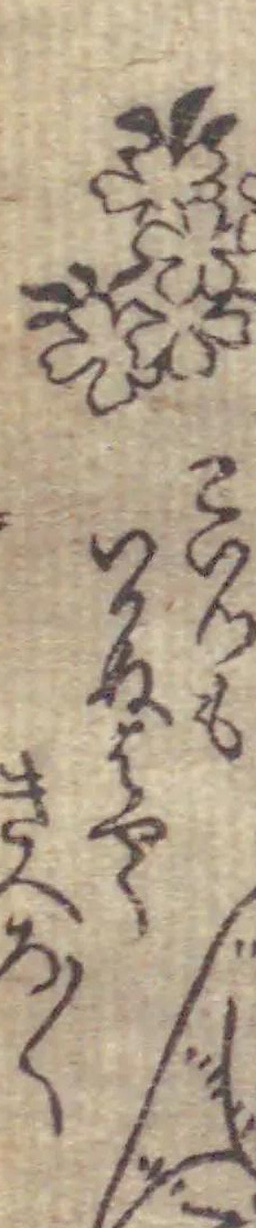いかぬはやく
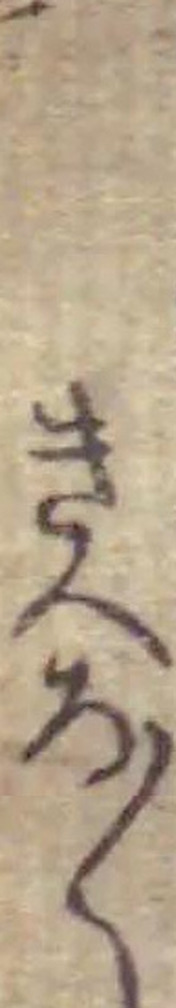きへろ〳〵
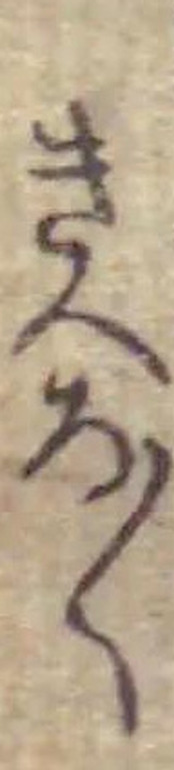きへろ〳〵

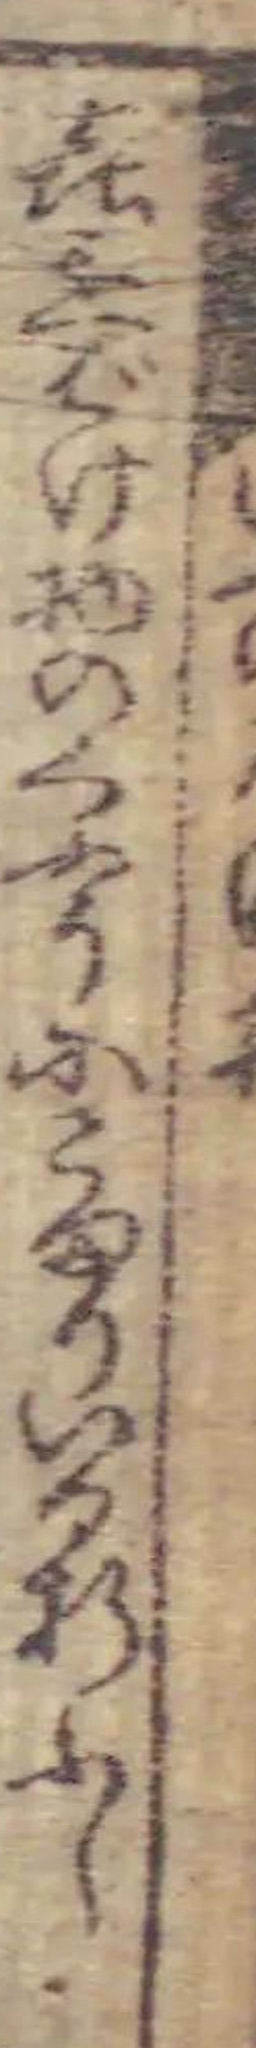喜三二ばけ物のくふうにこまりいる折ふし
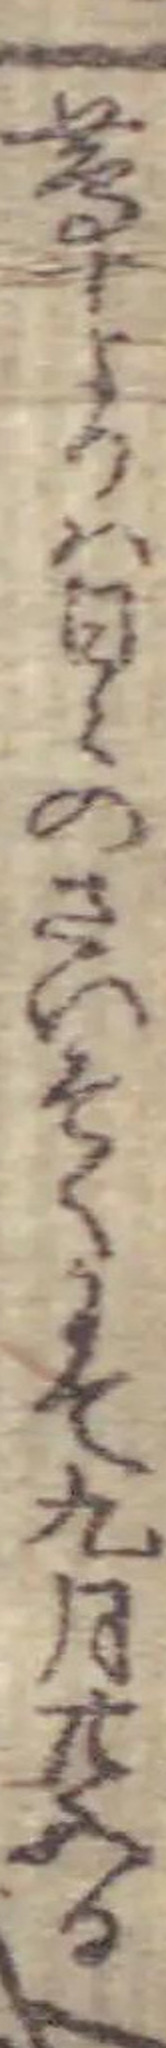蔦十よりは日々のさいそくにて九月廿五日
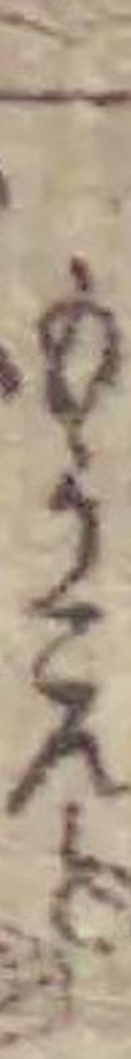もうこんど
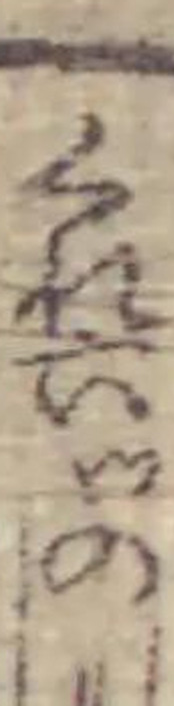くれ六つの
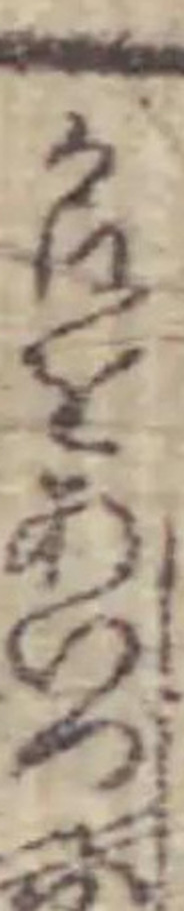かねをあいづに
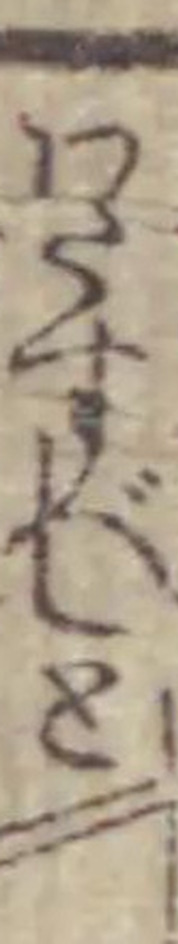わたすべしと
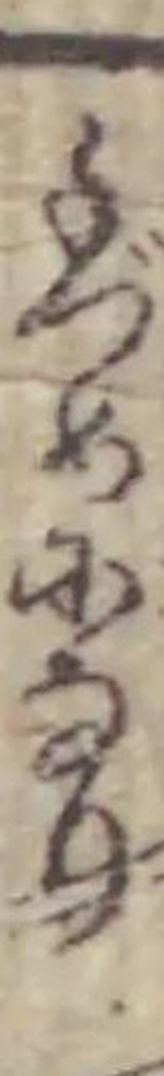てづめになり
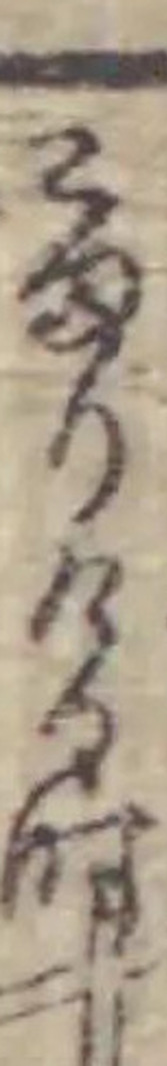こまりける時
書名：亀山人家妖 3巻
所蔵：国立国会図書館 National Diet Library, JAPAN
